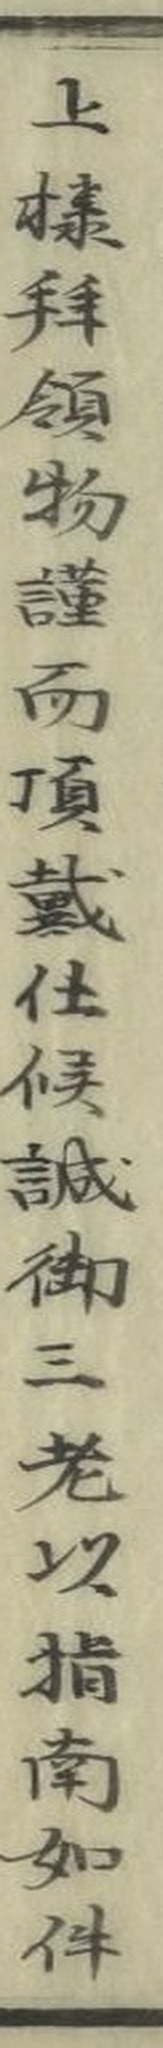上様拝領物謹而頂戴仕候誠御三老以指南如件
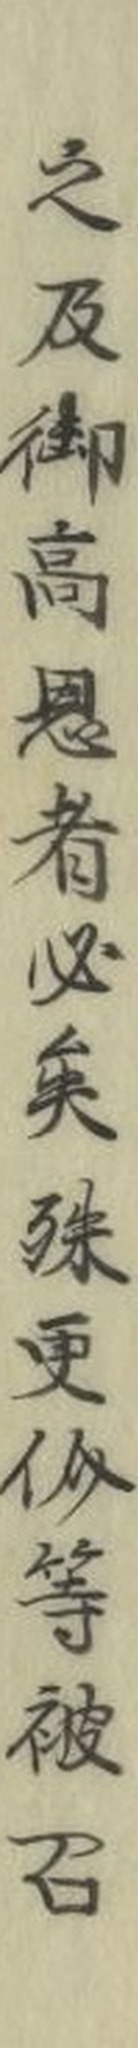之及御高恩者必矣殊更仍等被召
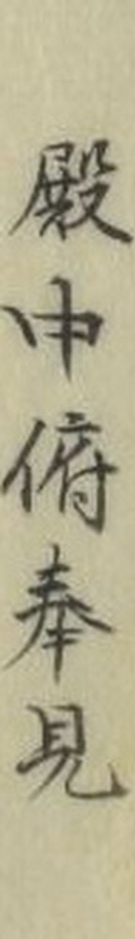殿中俯奉見
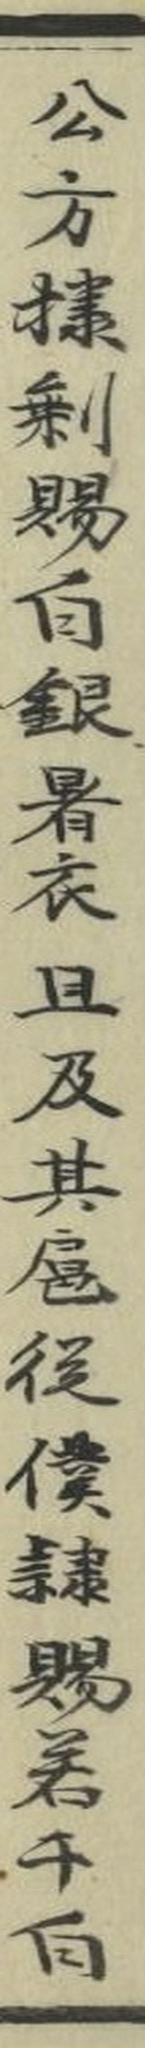公方様剰賜白銀夏衣且及其扈従僕隷賜若干白
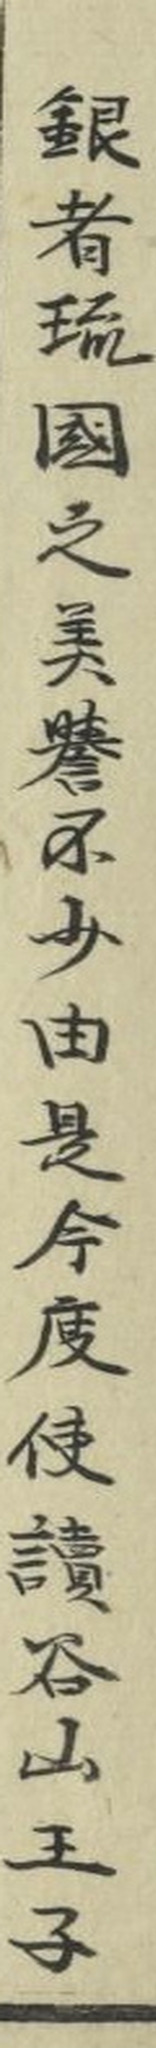銀者琉球国之美誉不少由是今度使読谷山王子
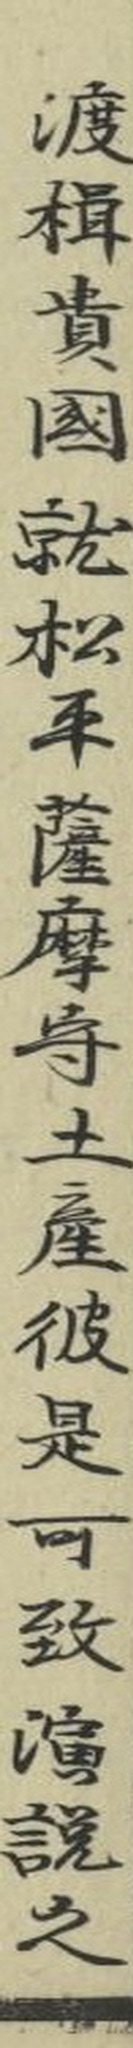渡楫貴国就松平薩摩守土産彼是可致演説之
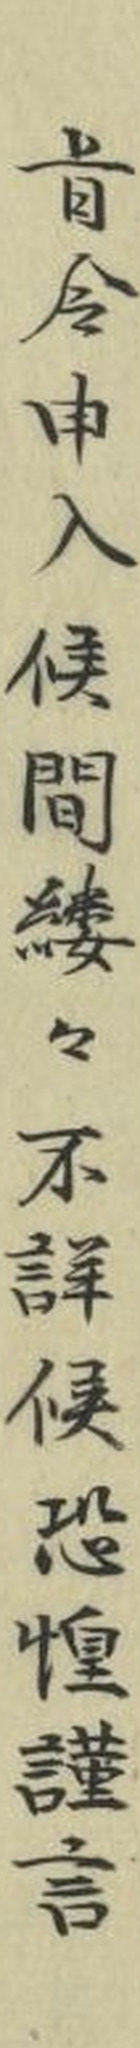旨令申入候間縷々不詳候恐惶謹言
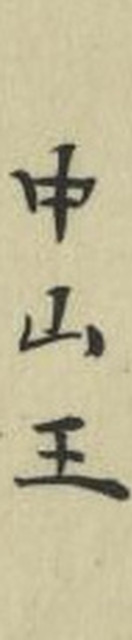中山王
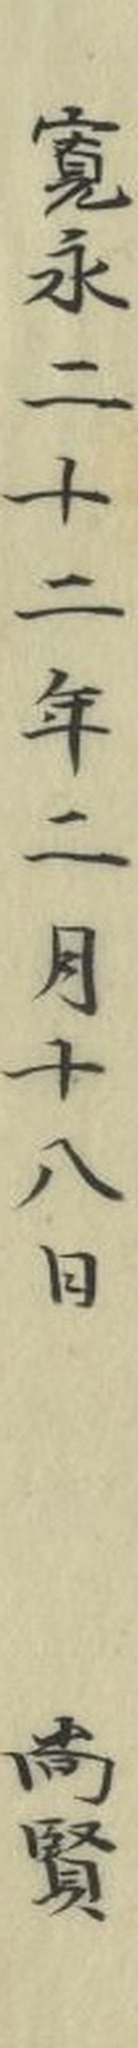寛永二十二年二月十八日尚賢
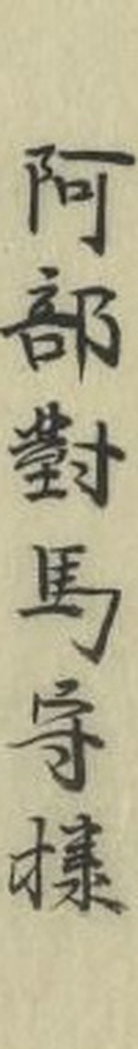阿部對馬守様
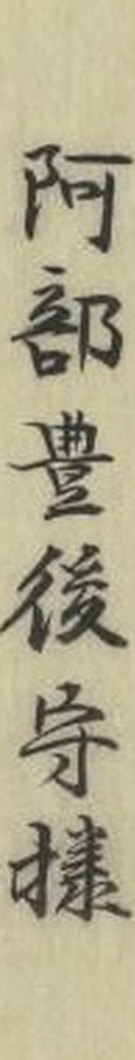阿部豊後守様
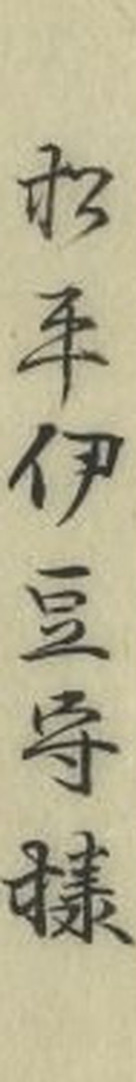松平伊豆守様

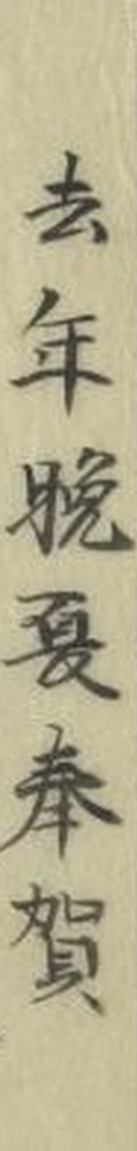去年晩夏奉賀
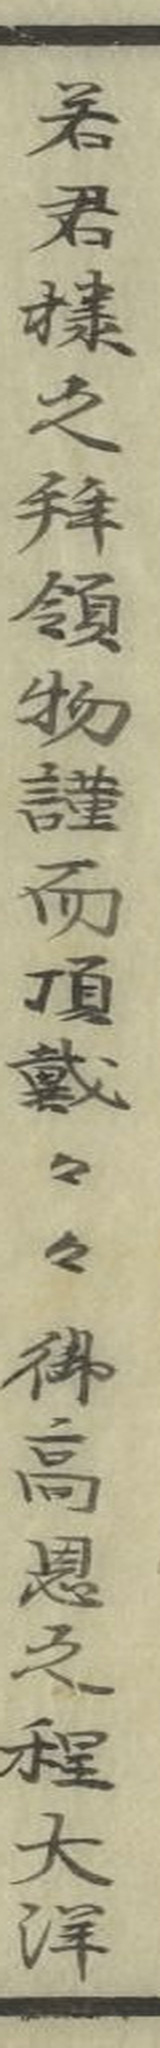若君様之拝領物謹而頂戴々々得高恩之程大洋
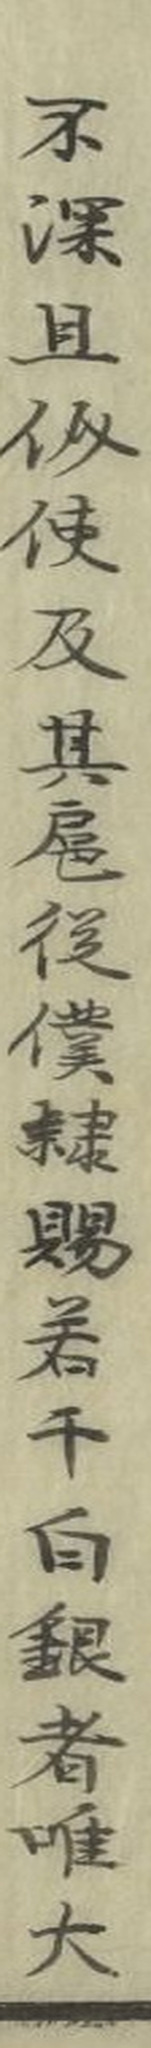不深且价使及其其扈従僕隷賜若干白銀者唯大
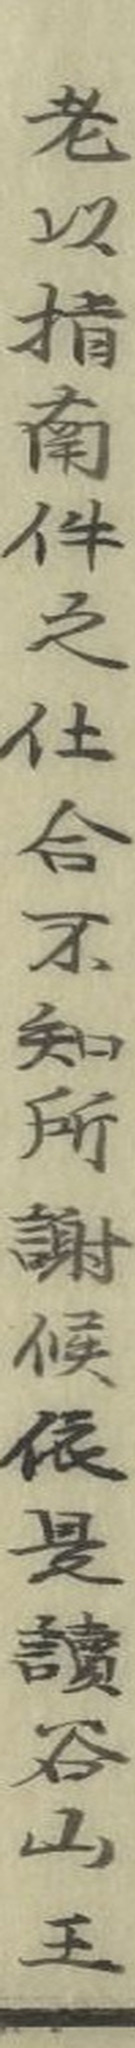老以指南件之仕合不知所謝候依是読谷山王
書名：琉球往来（上）
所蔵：University of the Ryukyus Library
